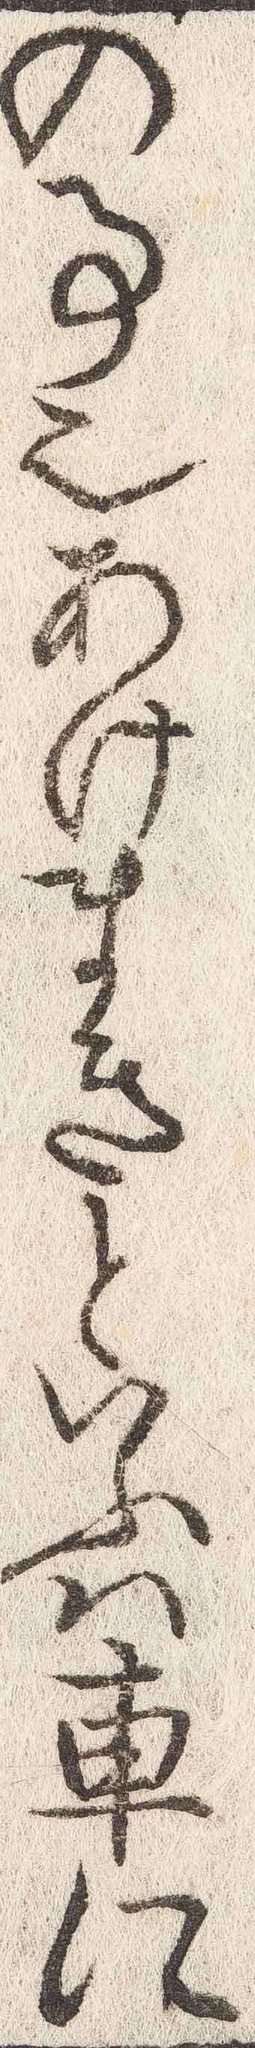の事也あけまきといふは車に
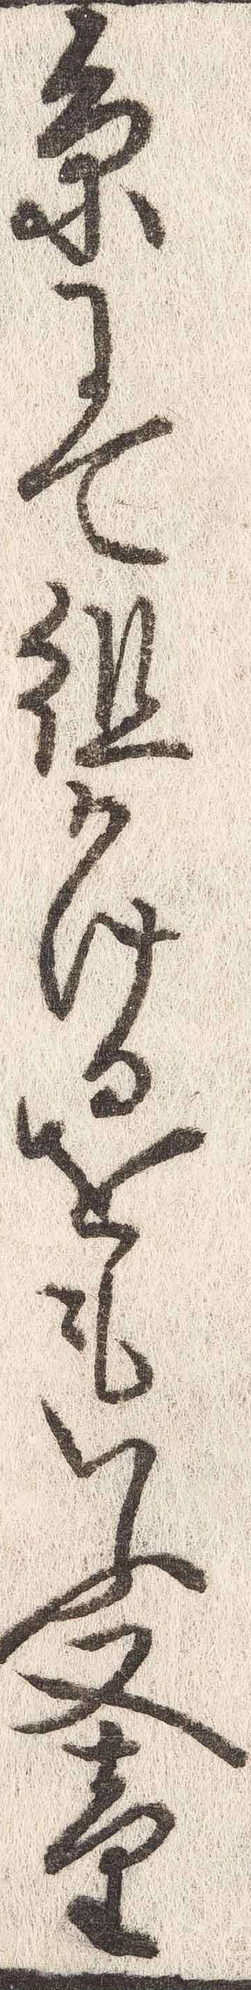糸にて組かけるをもいふ又童
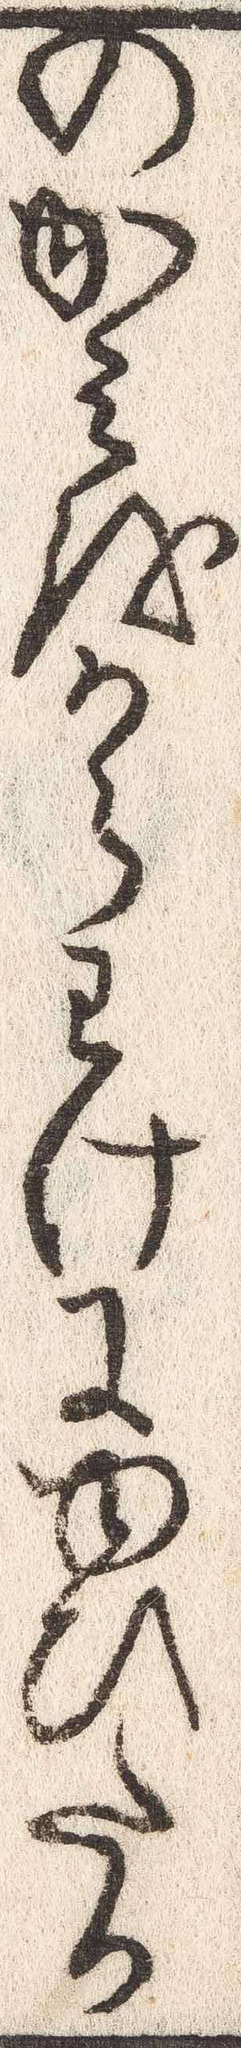のかみをからわけにゆひたる
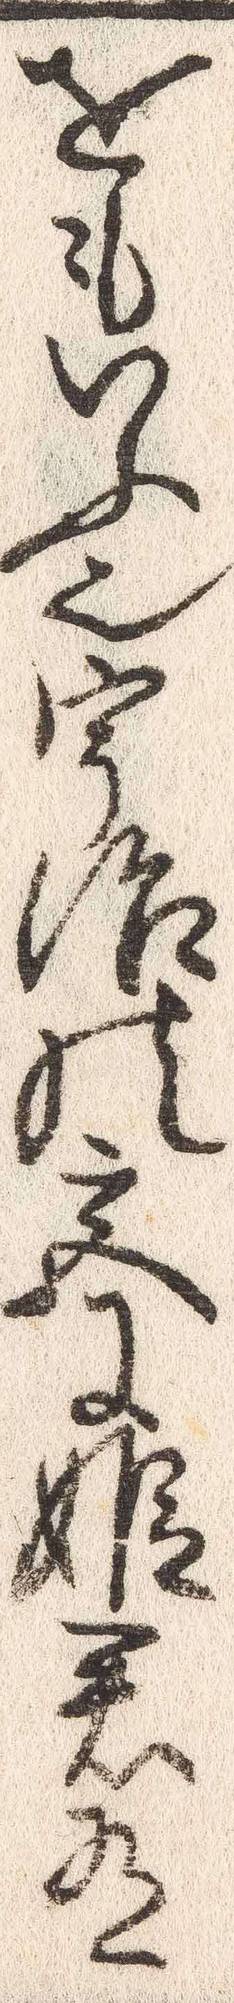をもいふ也宇治の宮に姫君有
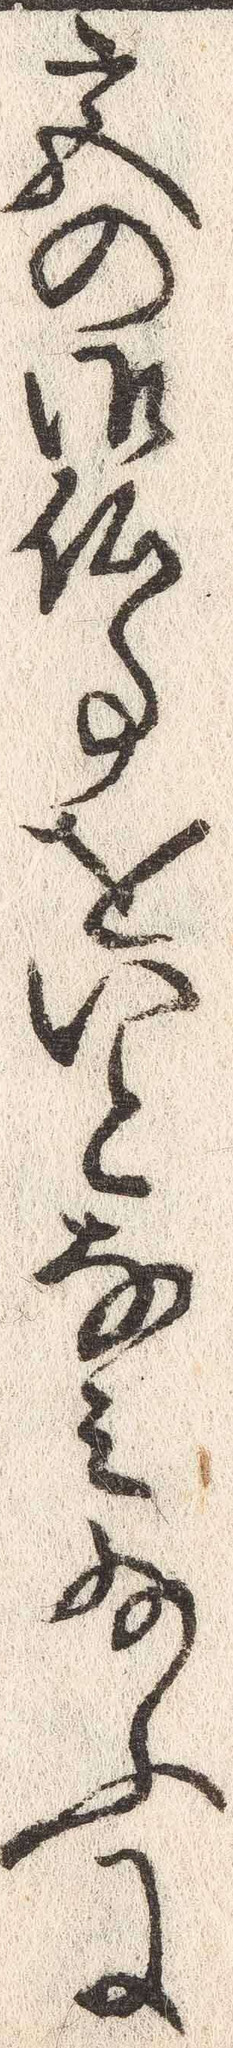宮の御仏事をいとなみ給ふに
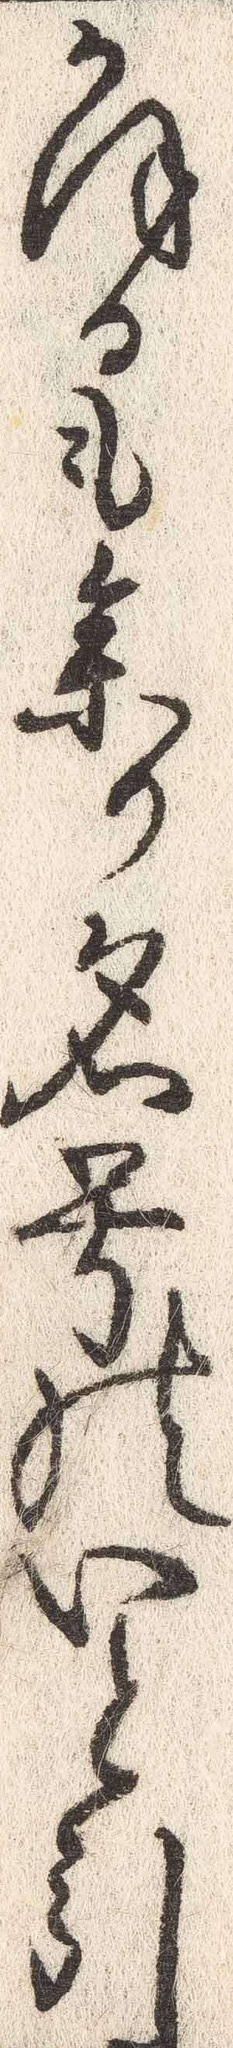かほるも参り名号のいと引
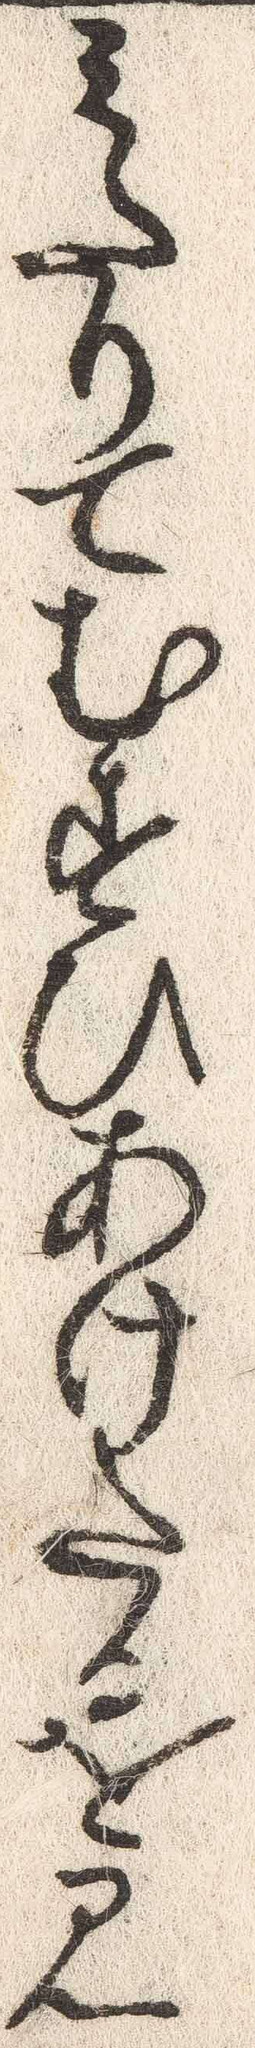みたりてむすひあけたるを見

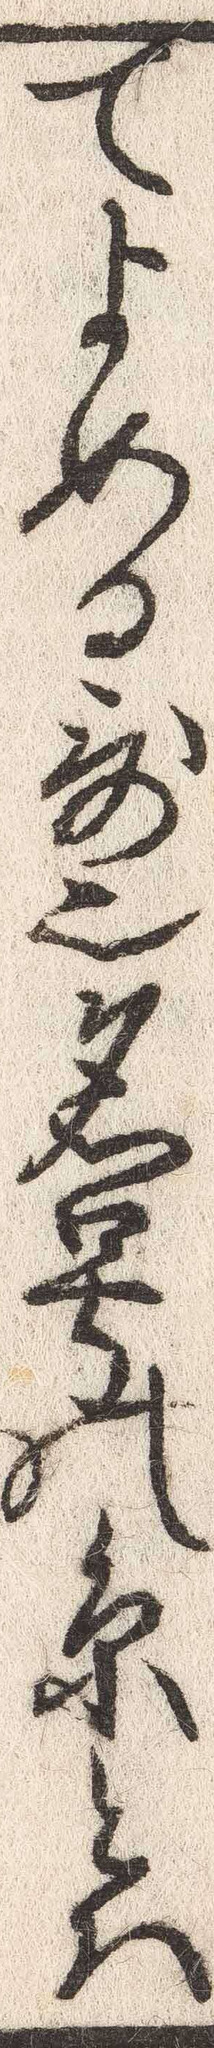てよめる哥也名号の糸とは
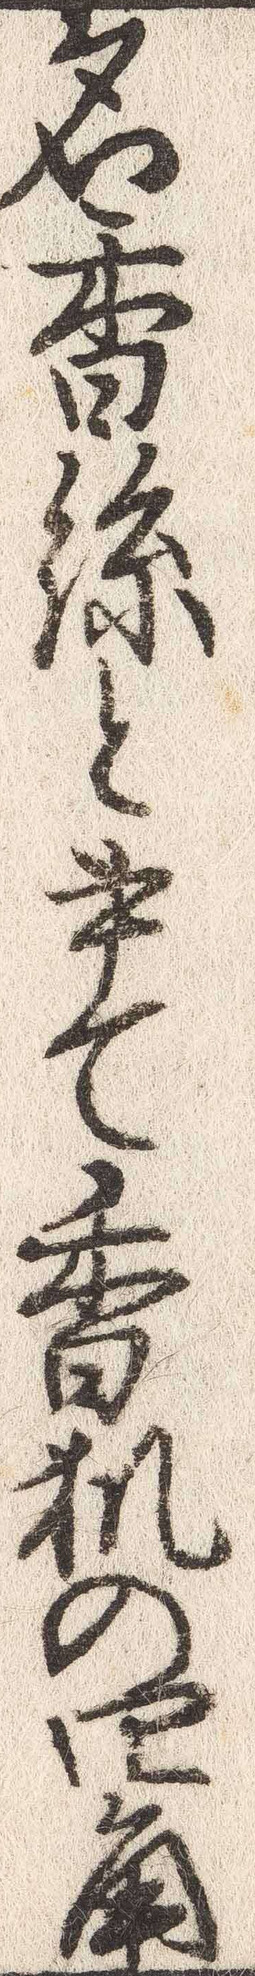名香糸と書て香机の四角
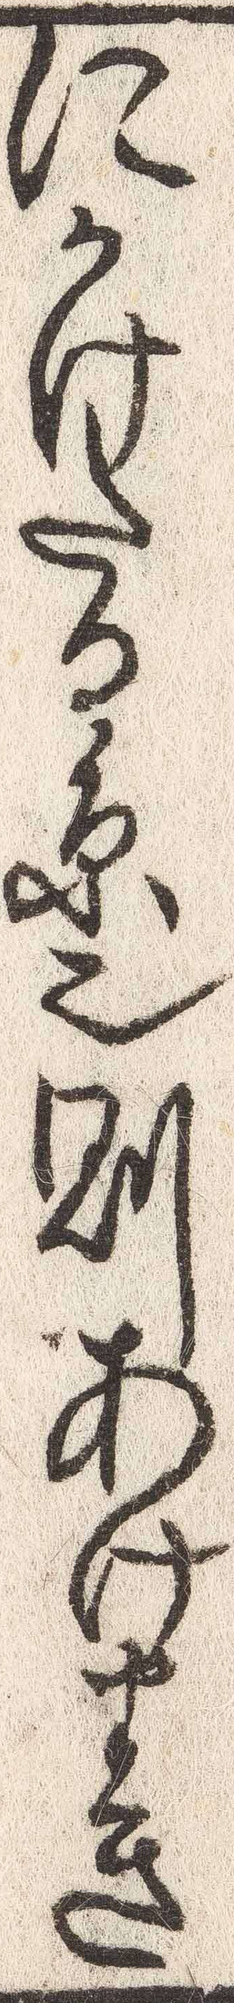にかけたる糸也則あけまき
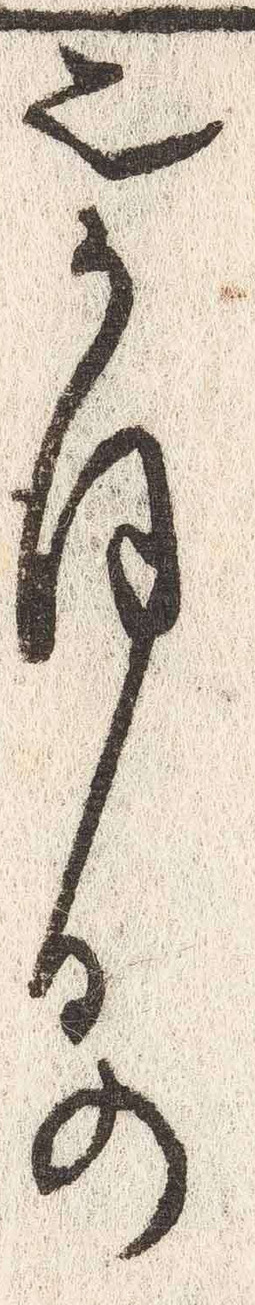也かほるの
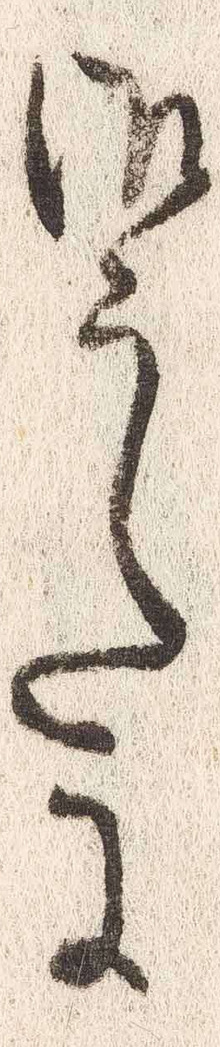御うたに
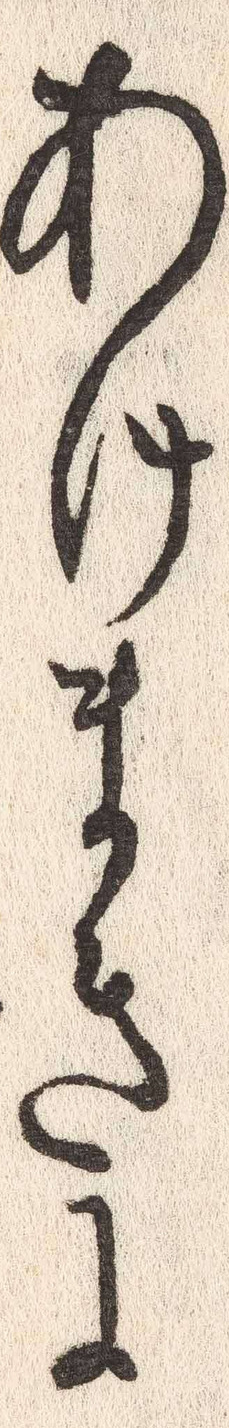あけまきに
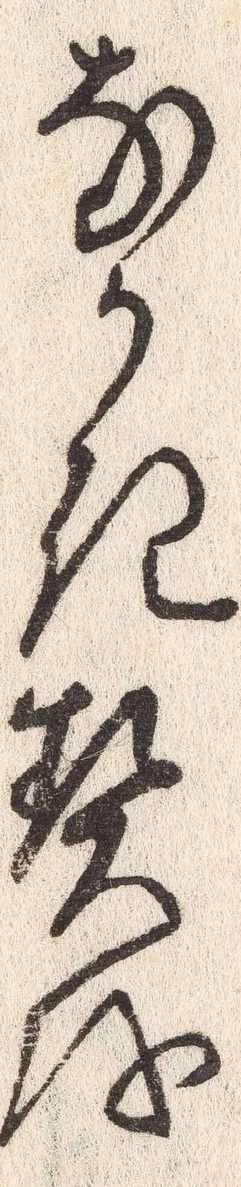なかき契を
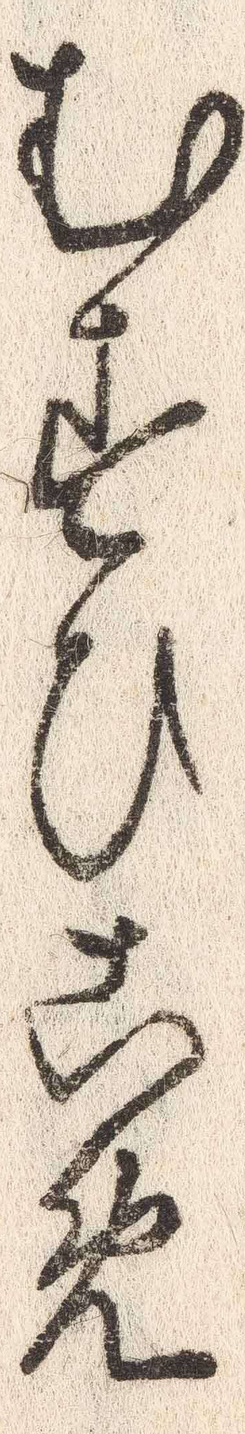むすひこめ
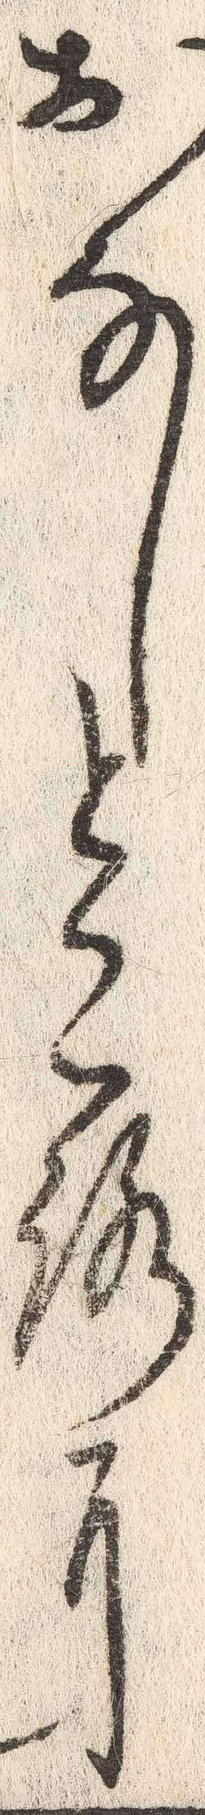おなしところに
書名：源氏物語
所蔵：東京学芸大学附属図書館 国文学研究資料館
